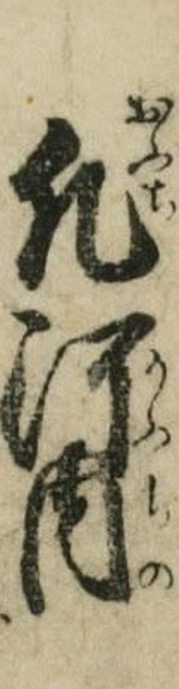凡河内
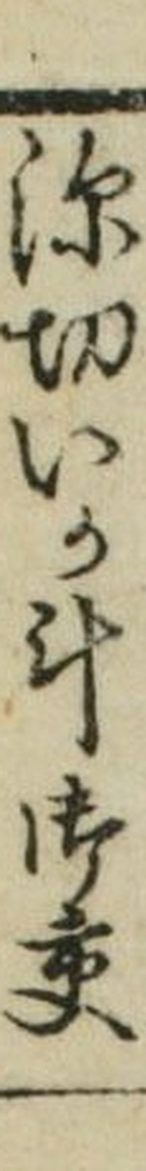深切いか計御交
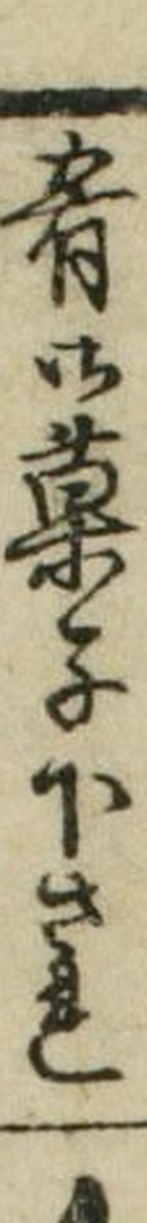肴御菓子下され
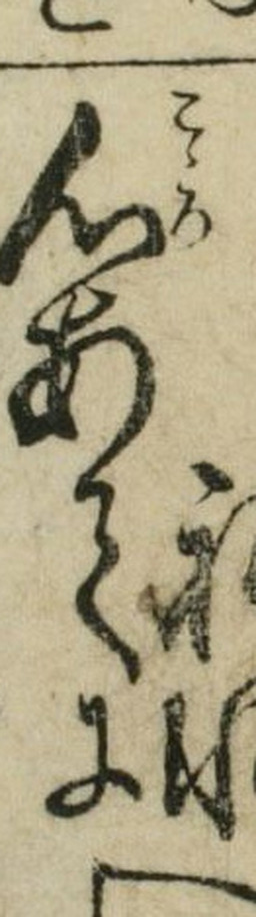心あてに
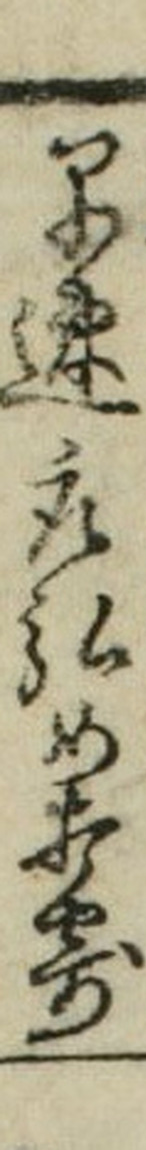早速取弘め打寄
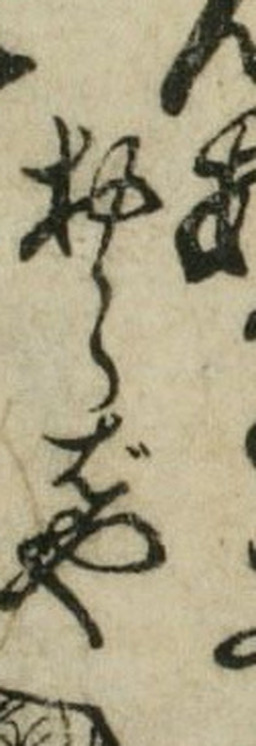おらばや
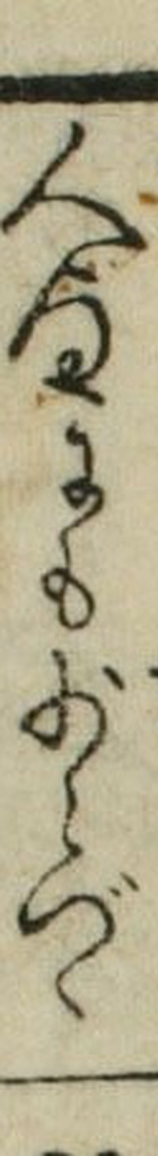人さまにも少々づゝ
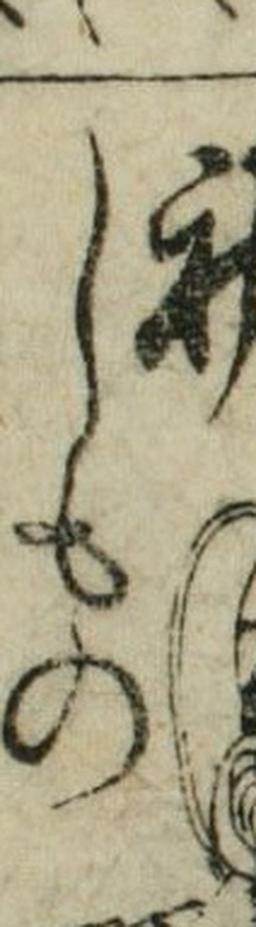しもの
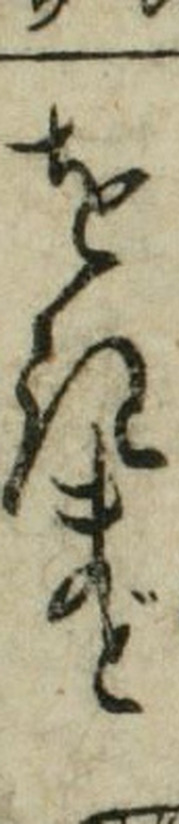をきまど
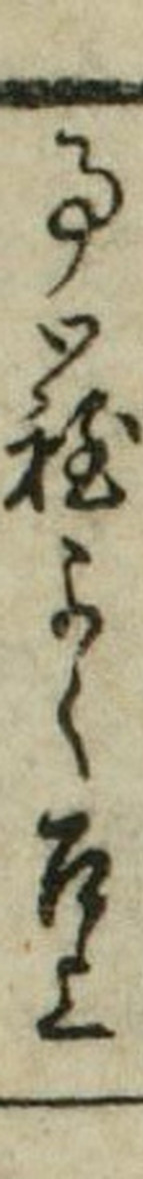事御程よく召上
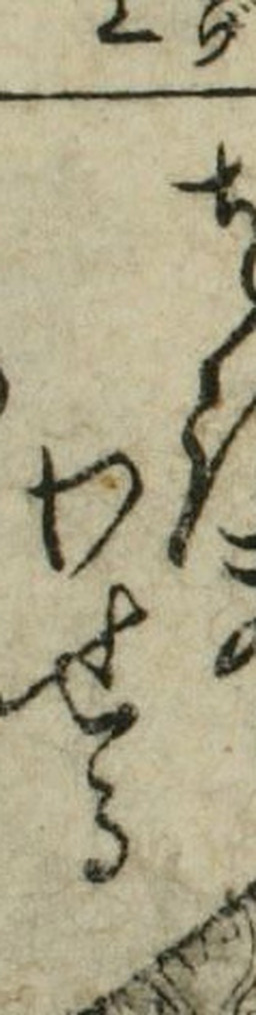わせる
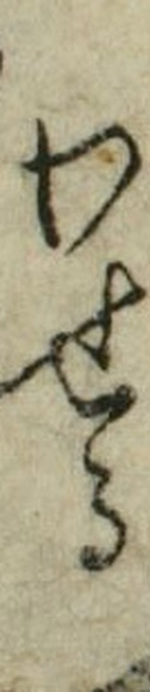わせる
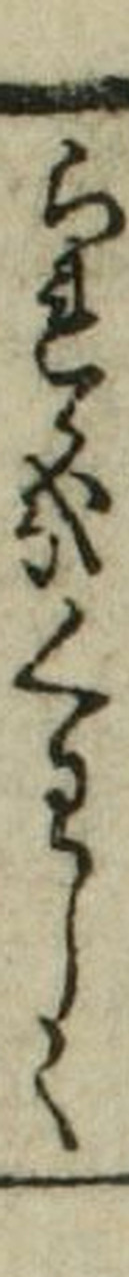られ候哉くわしく
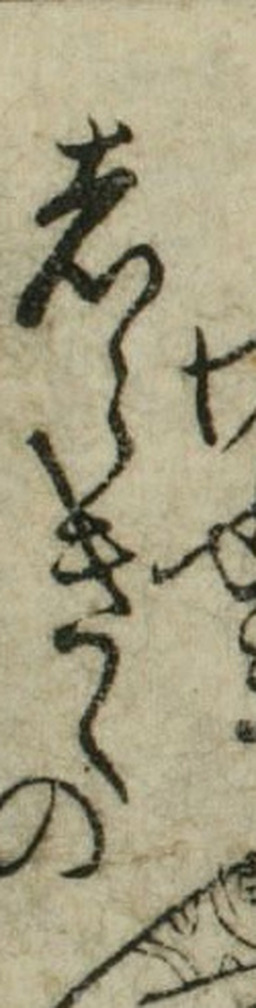しらきくの
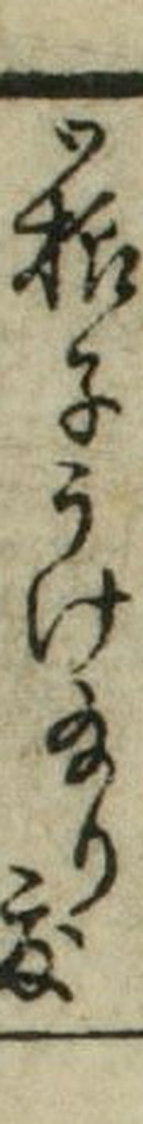御様子うけ給り度

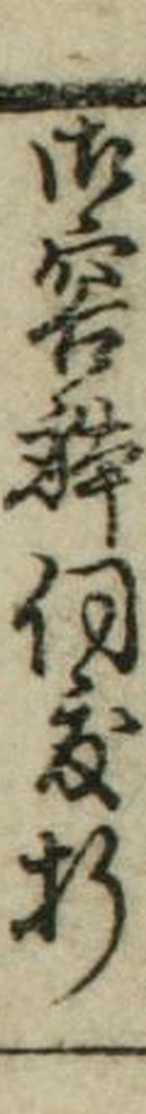御容体伺度折
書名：百人一首
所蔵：東京学芸大学教育コンテンツアーカイブ
